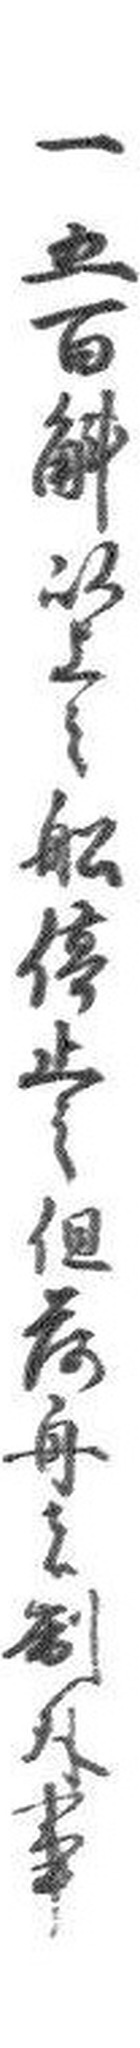一五百斛以上之船停止之但荷舟は制外事
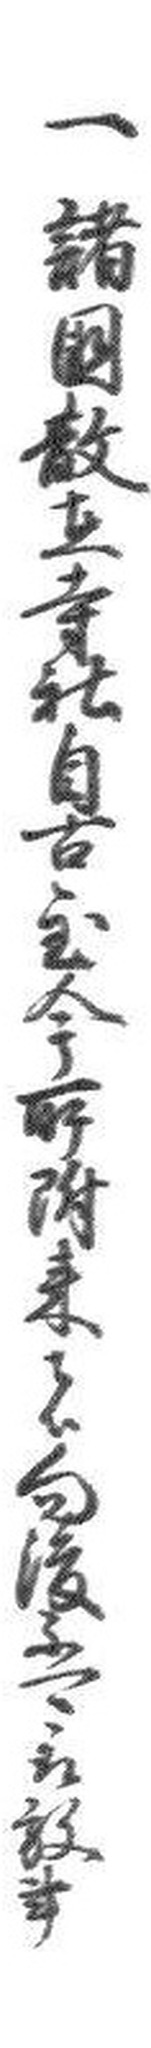一諸国散在寺社自古至今所附来者向後不可取放事
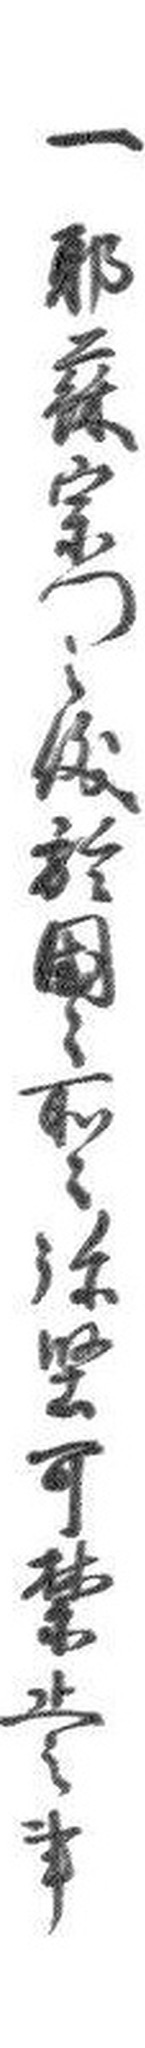一耶蘇宗門之儀於国々所々弥堅可禁止之事
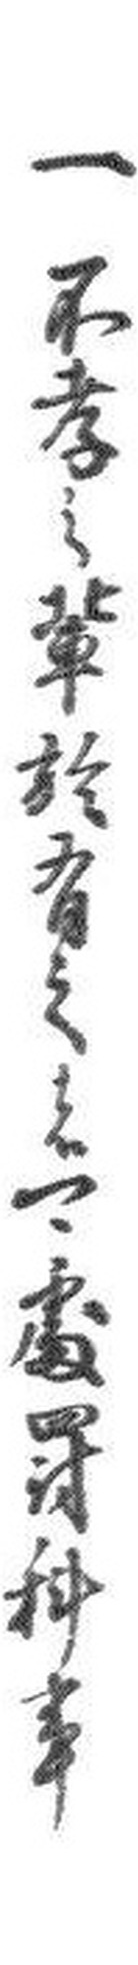一不孝之輩於有之者可処罰科事
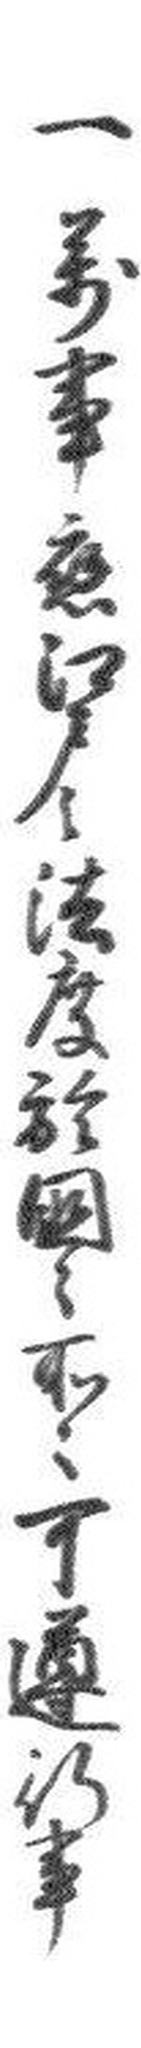一万事応江戸之法度於国々所々可遵行事
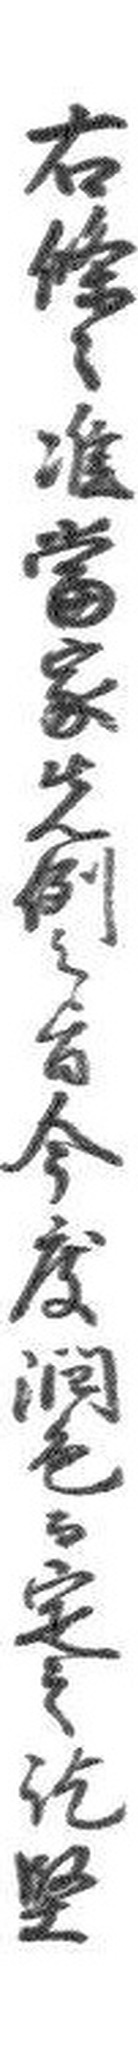右条々准当家先例之旨今度潤色而定之訖堅

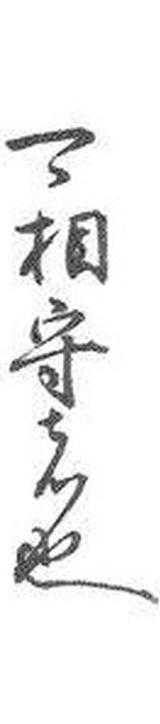可相守者也
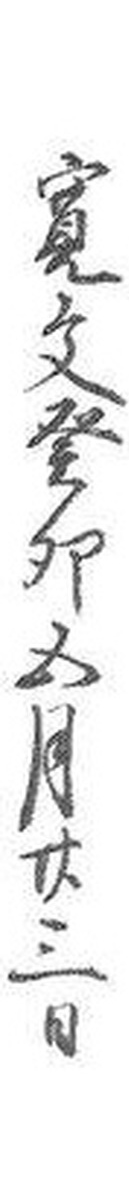寛文癸卯五月廿三日
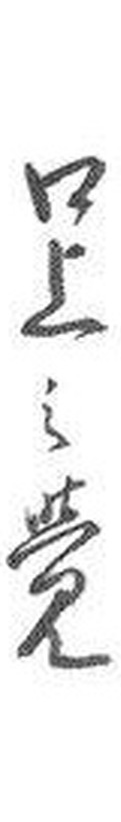口上之覚
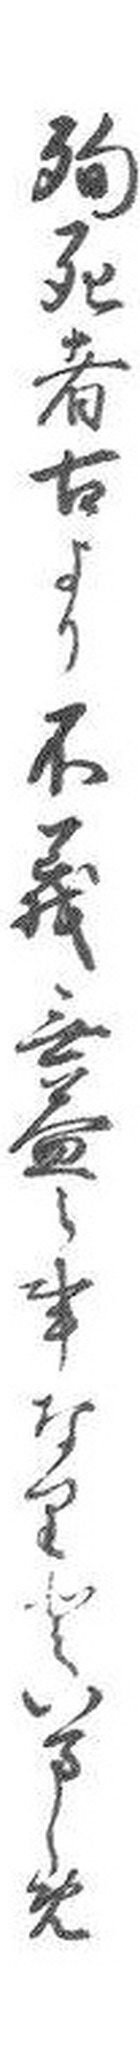殉死者古より不義無益之事なりといましめ
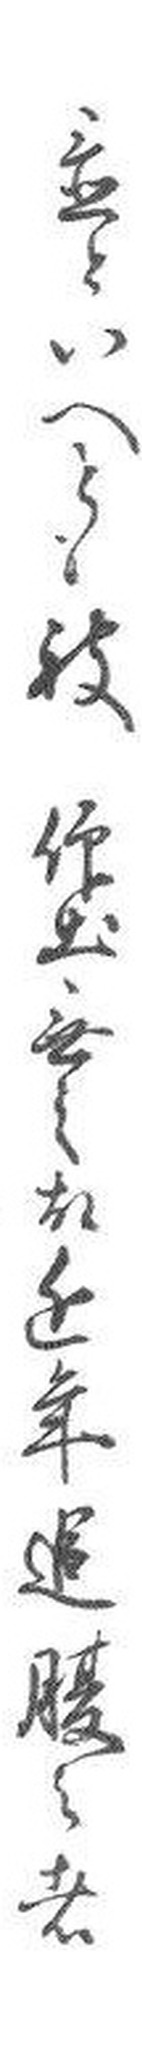置といへとも被仰出無之故近年追腹之者
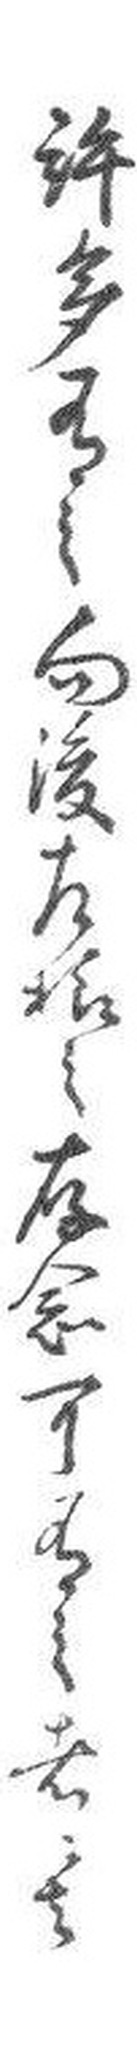許多有之向後左様之存念可有之者ニは
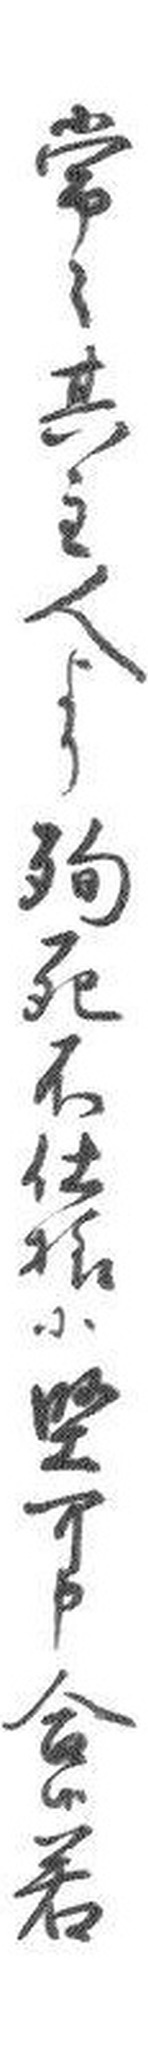常々其主人より殉死不仕様に堅可申合候若
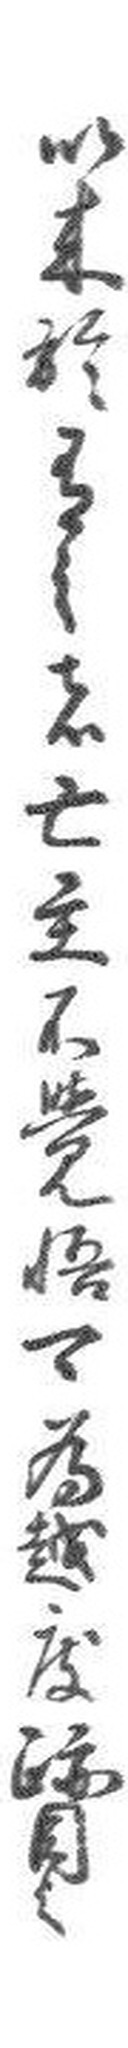以来於有之者亡主不覚悟可為越度跡目之
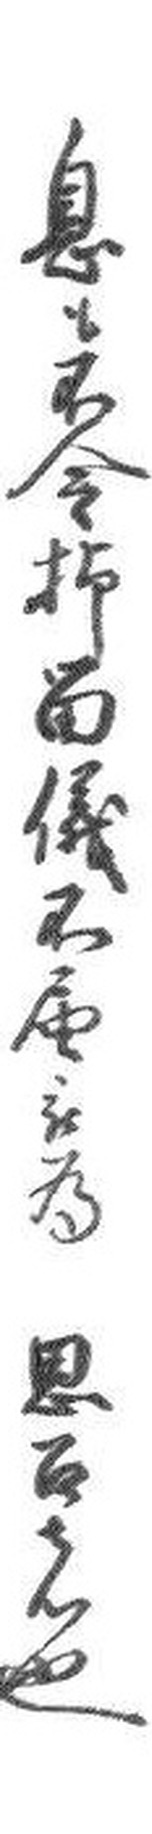息も不令抑留儀不届被為思召者也
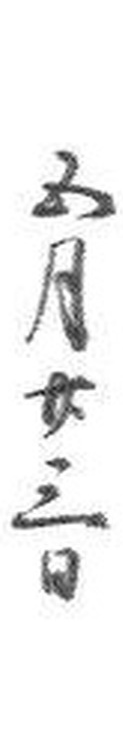五月廿三日
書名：家譜 六 光通公 従万治三年到寛文三年
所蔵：福井県文書館 Fukui Prefectural Archives
